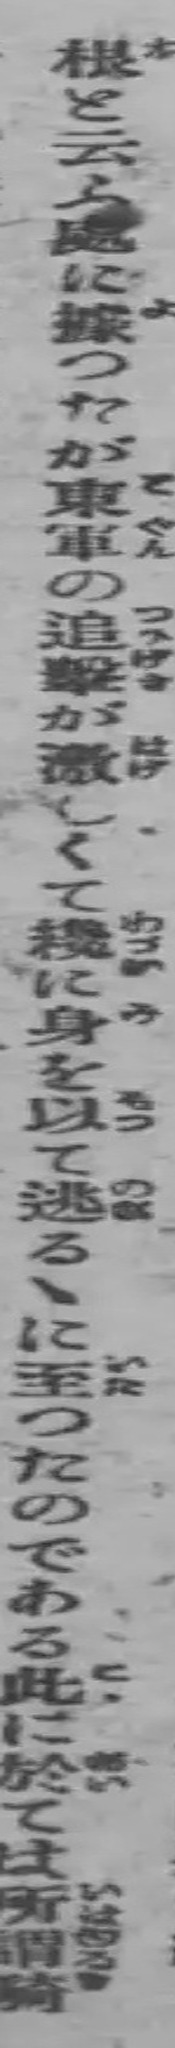根と云ふ処に拠つたが東軍の追撃が激しくて纔に身を以て逃るゝに至つたのである此に於ては所謂騎
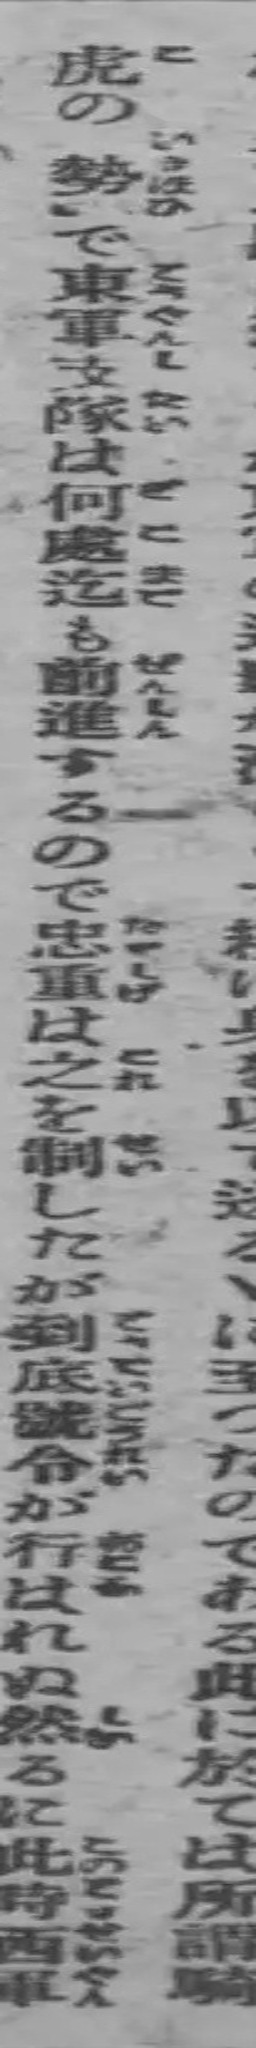虎の勢で東軍支隊は何処迄も前進するので忠重は之を制したが到底号令が行はれぬ然るに此時西軍
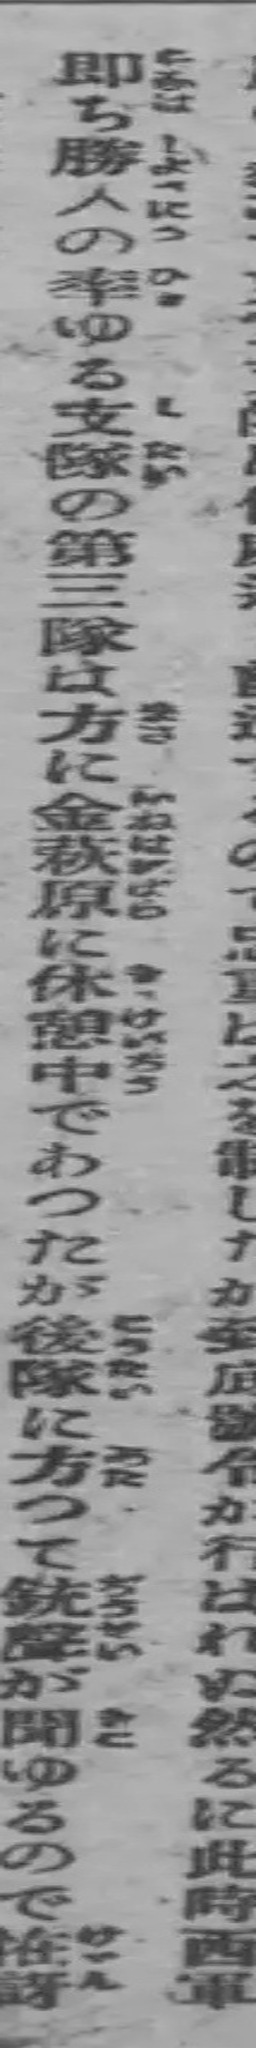即ち勝入の率ゆる支隊の第三隊は方に金萩原に休憩中であつたが後隊に方つて銃声が聞ゆるので恠訝
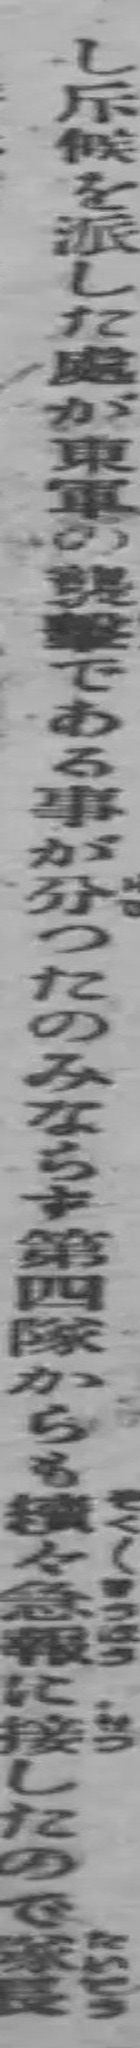し斥候を派した処が東軍の襲撃である事が分つたのみならず第四隊からも続々急報に接したので隊長
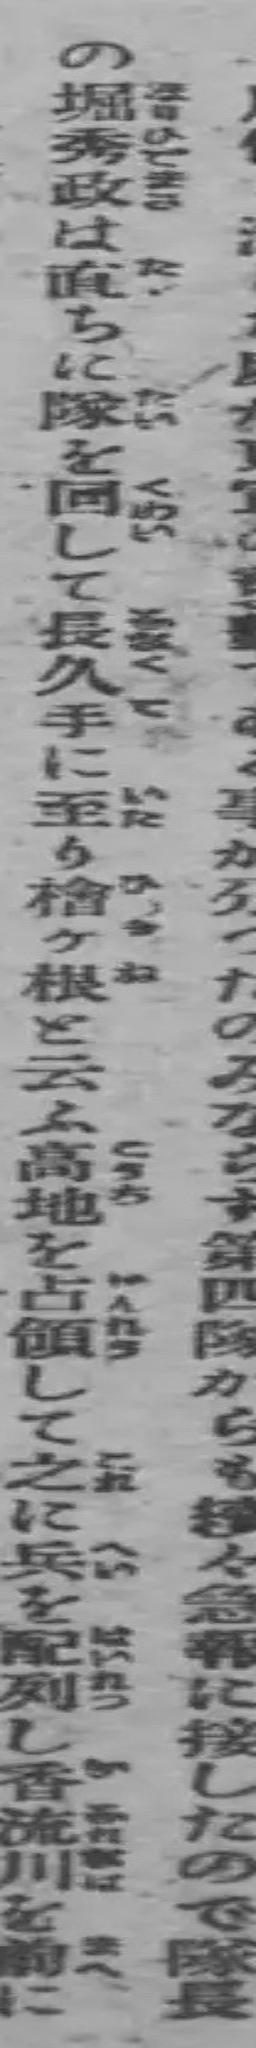檜ケ根の堀秀政は直ちに隊を回して長久手に至り檜ケ根と云ふ高地を占領して之に兵を配列し香流川を前に
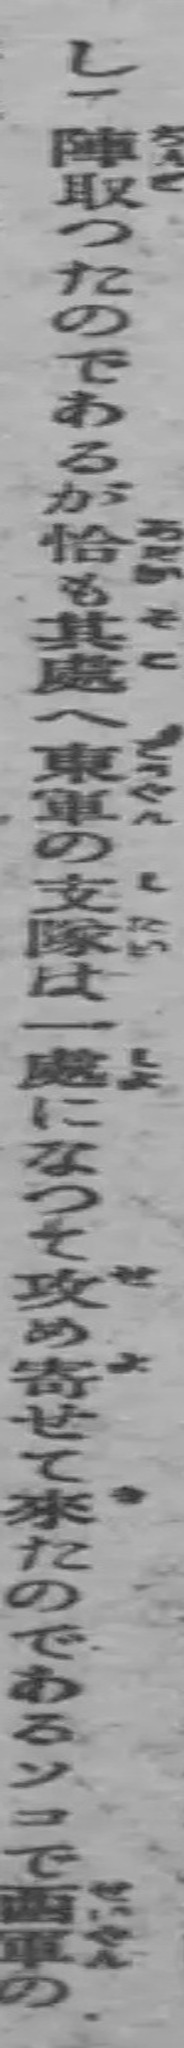して陣取つたのであるが恰も其処へと東軍の支隊は一処になつて攻め寄せて来たのであるソコで西軍の
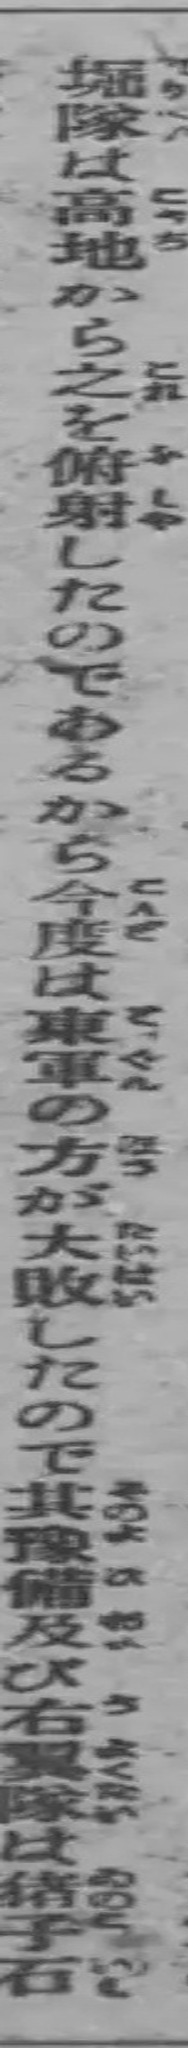堀隊は高地から之を俯射したのであるから今度は東軍の方が大敗したので其予備及び右翼隊は猪子石
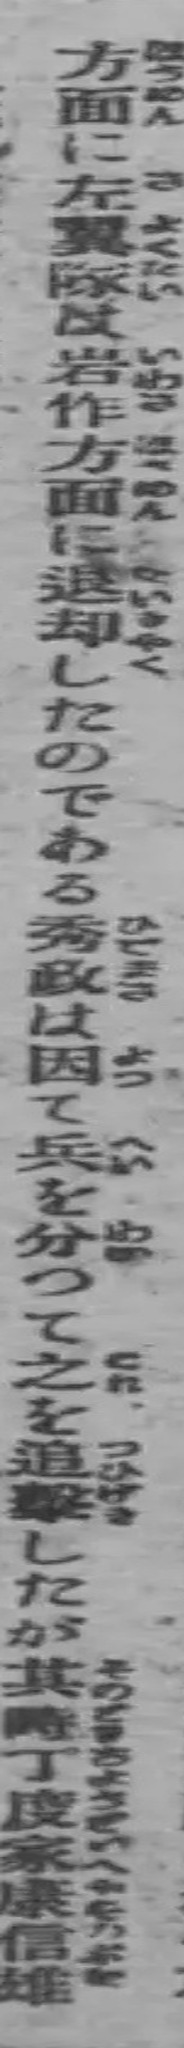方面に左翼隊は岩作方面に退却したのである秀政は因て兵を分つて之を追撃したが其時丁度家康信雄
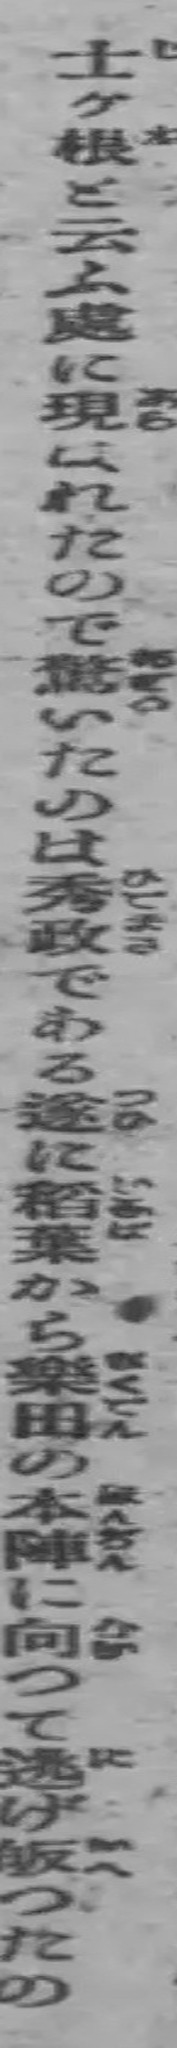士ケ根と云ふ処に現はれたので驚いたのは秀政である遂に稲葉から楽田の本陣に向つて逃げ皈つたの
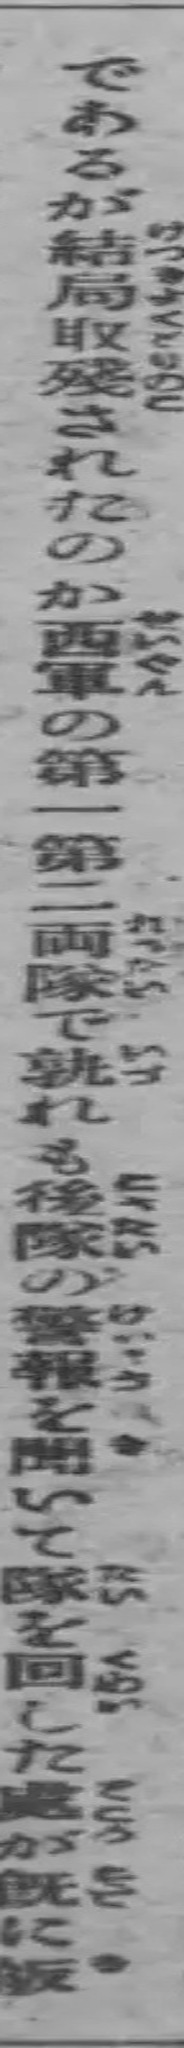であるが結局取残されたのか西軍の第一第二両隊で孰れも後隊警報を聞いて隊を回した処が既に皈
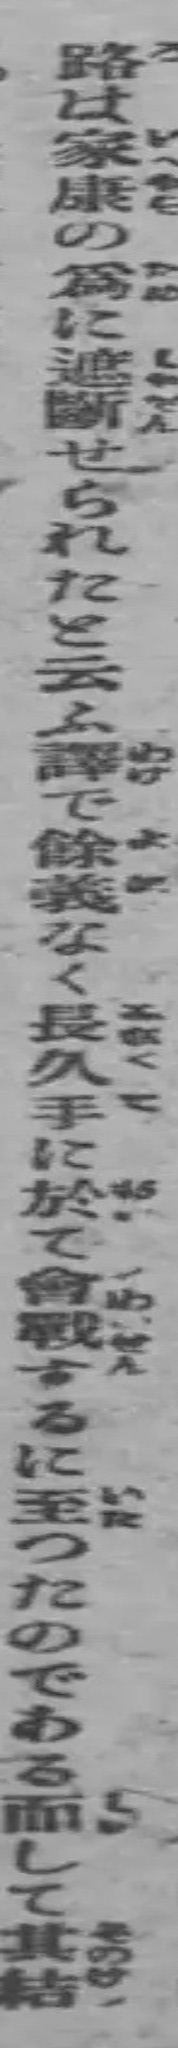路は家康の為に遮断せられたと云ふ訳で余義なく長久手に於て会戦するに至つたのである而して其結
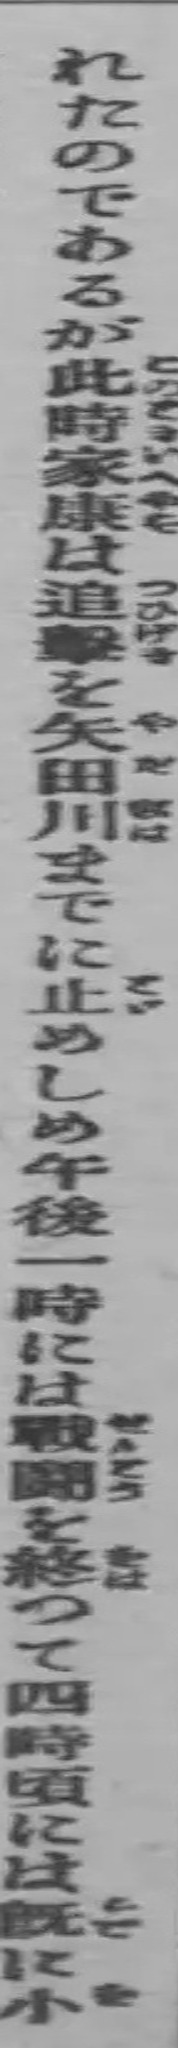れたのであるが此時家康は追撃を矢田川までに止めしめ午後一時には戦闘を終つて四時頃には既に小
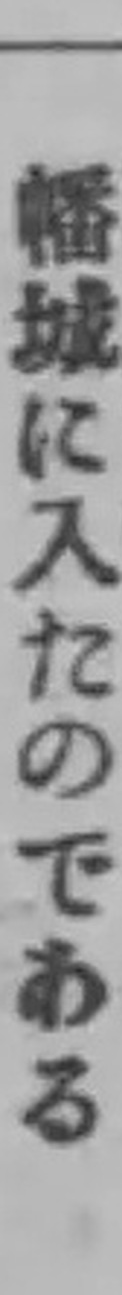幡城に入たのである
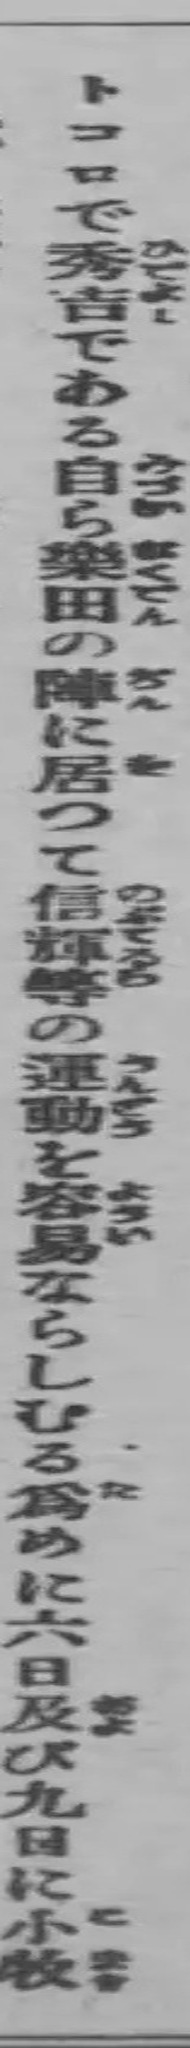トコロで秀吉である自ら楽田の陣に居つて信輝等の運動を容易ならしむる為めに六日及び九日に小牧
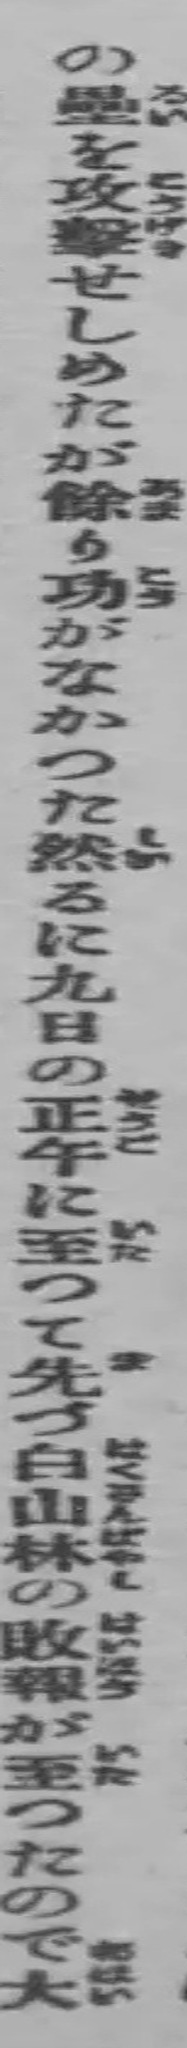の塁を攻撃せしめたが余り功がなかつた然るに九日の正午に至つて先づ白山林の敗報が至つたので大
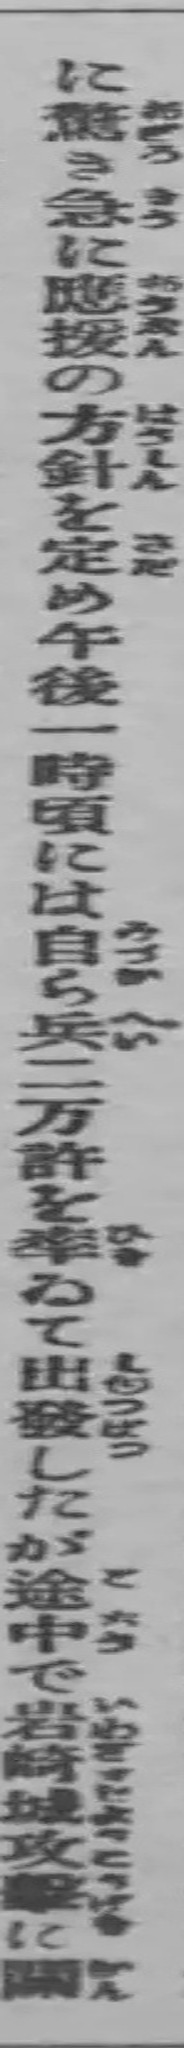に驚き急に応援の方針を定め午後一時頃には自ら兵二万許を率ゐて出発したが途中で岩崎城攻撃に関
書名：豊橋市史談
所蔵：国立国会図書館 National Diet Library, JAPAN
